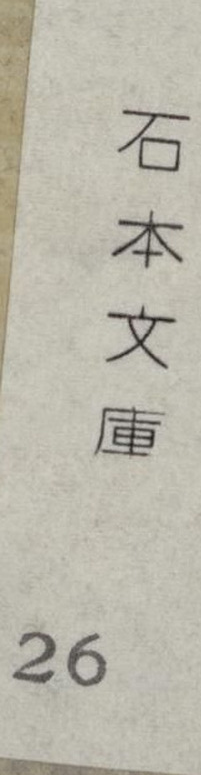石本文庫
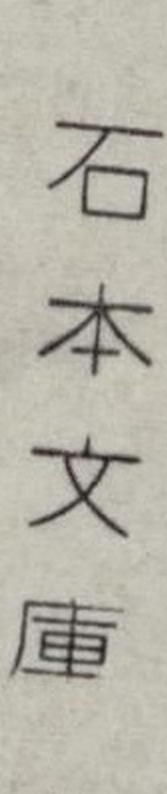石本文庫
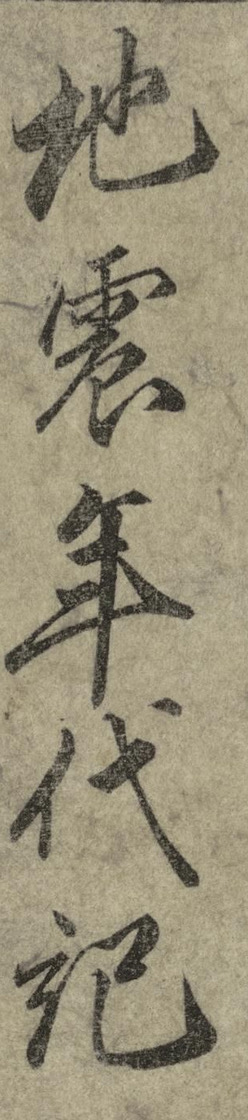地震年代記

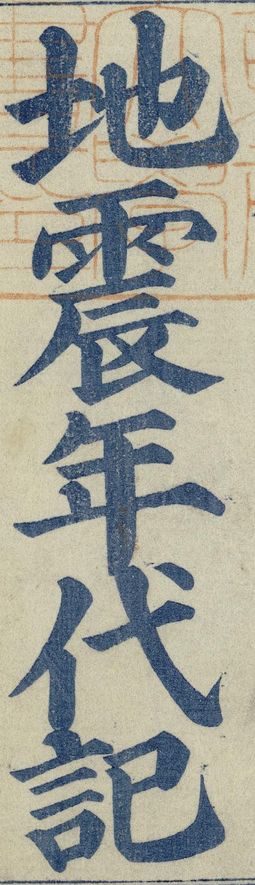地震年代記
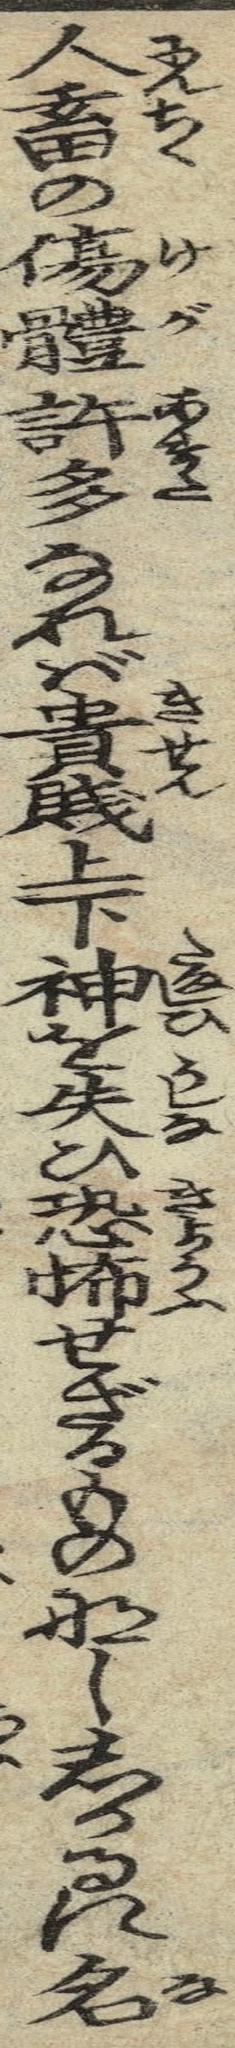人畜の傷體許多なれば貴賎上下神を失ひ恐怖せざるものなししかるに名
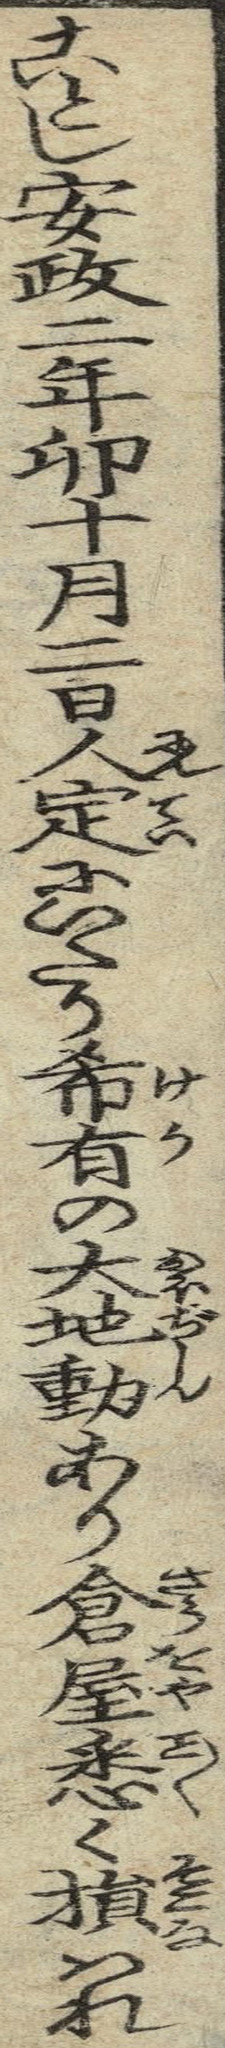ことし安政二年卯十月二日人定にいたり希有の大地動あり倉屋悉く損はれ
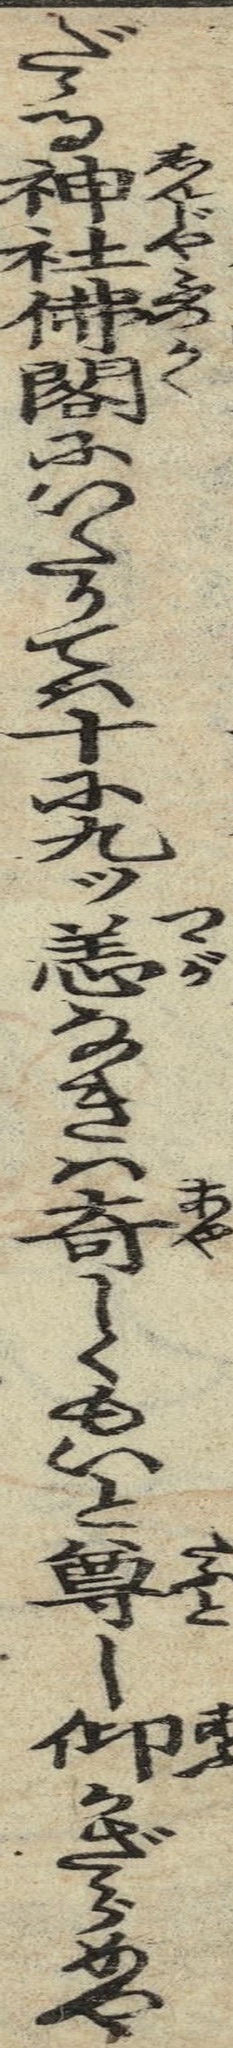だゝる神社佛閣にいたりては十に九ツ恙なきは奇しくもいと尊し仰かざらめや
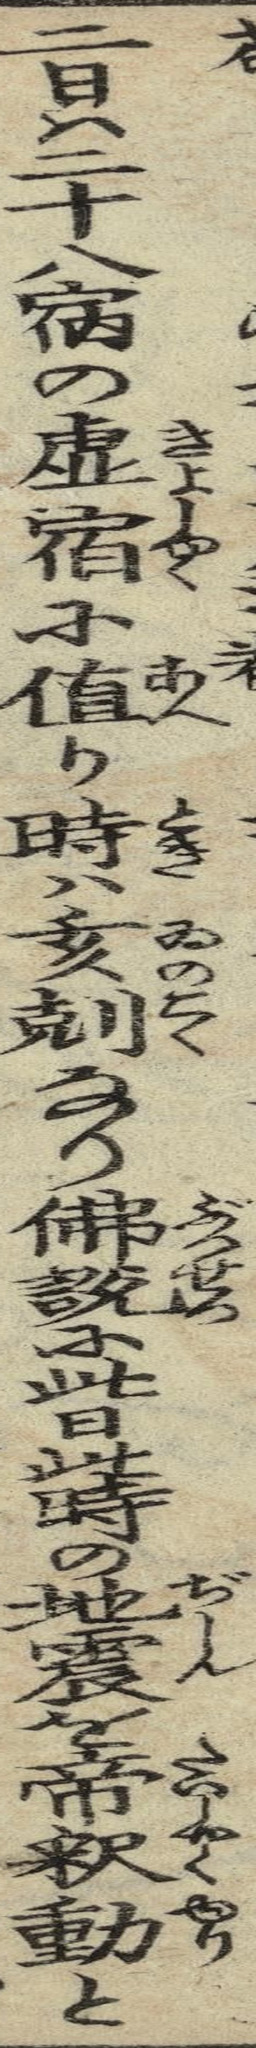二日は二十八宿の虚宿に値り時は亥刻なり佛説に此日此時の地震を帝釈動と
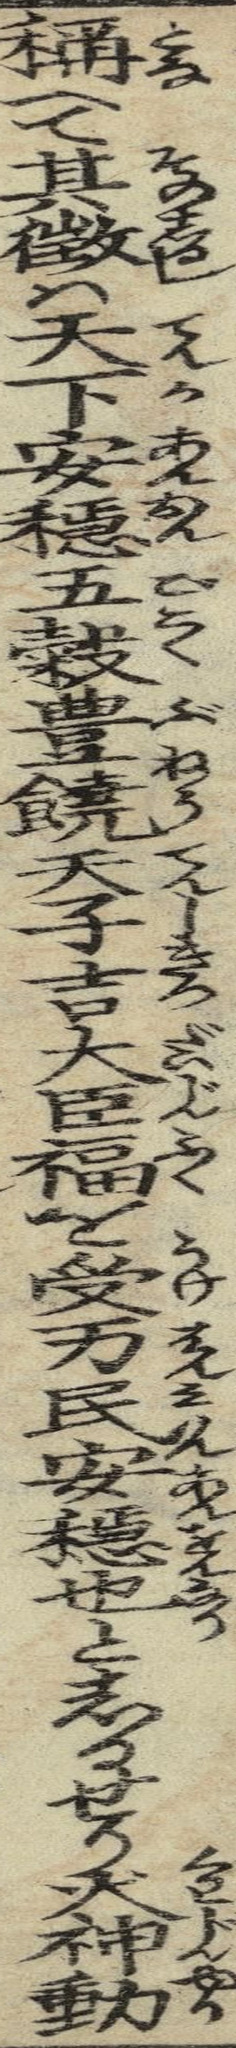称へて其徴は天下安穩五穀豊饒天子吉大臣福を受万民安穩也としるせり火神動
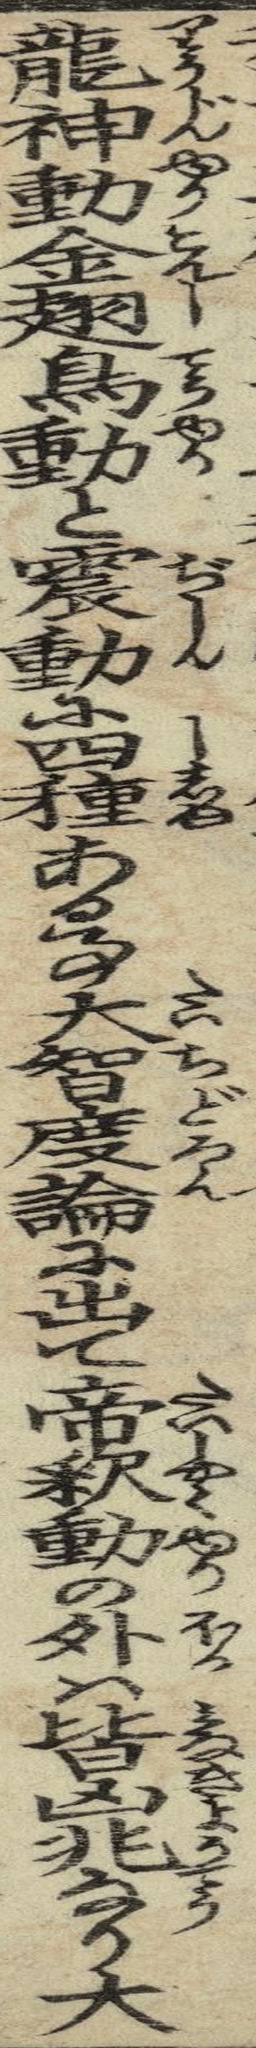龍神動金翅鳥動と震動に四種ある事大智度論に出て帝釈動の外は皆凶兆なり大
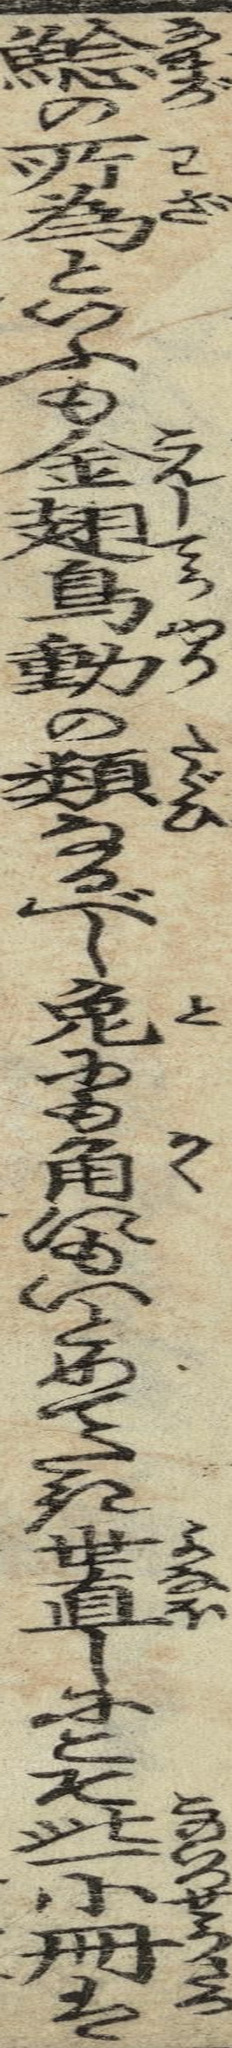鯰の所為といふも金翅鳥動の類なるべし兔にも角にもいとめてたき世直しにこそ此一小冊は
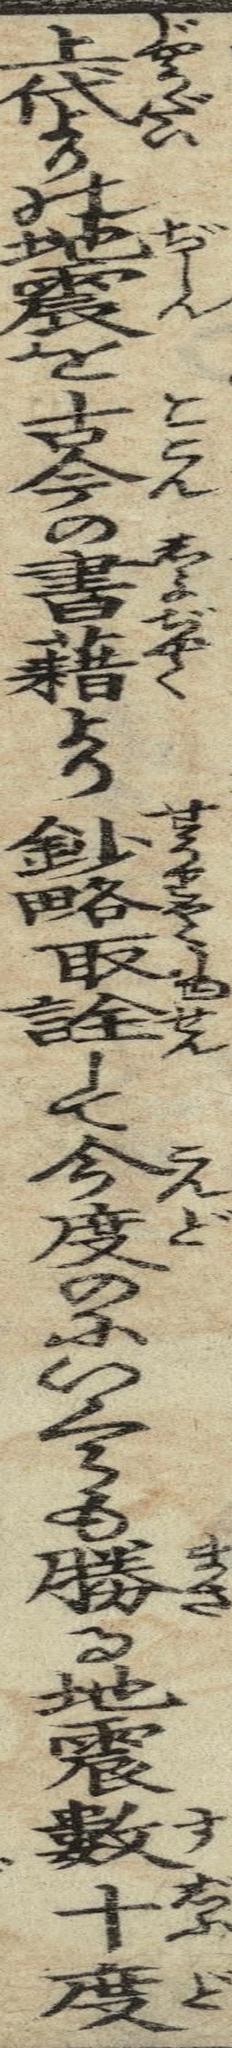上代よりの地震を古今の書籍より鈔略取詮して今度のにいくらも勝る地震数十度
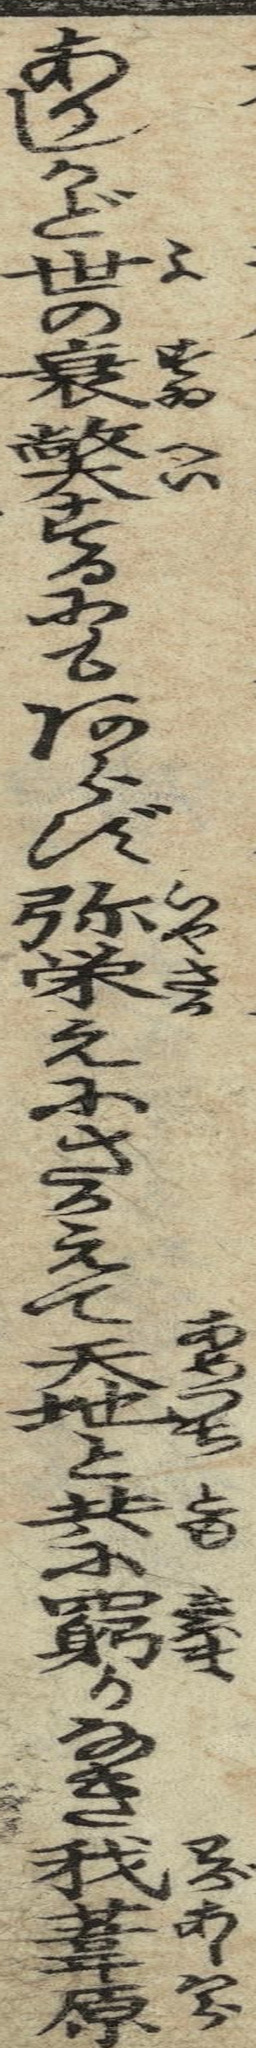ありしかど世の衰獘するにもあらず弥栄えにさかえて天地と共に窮りなき我葦原
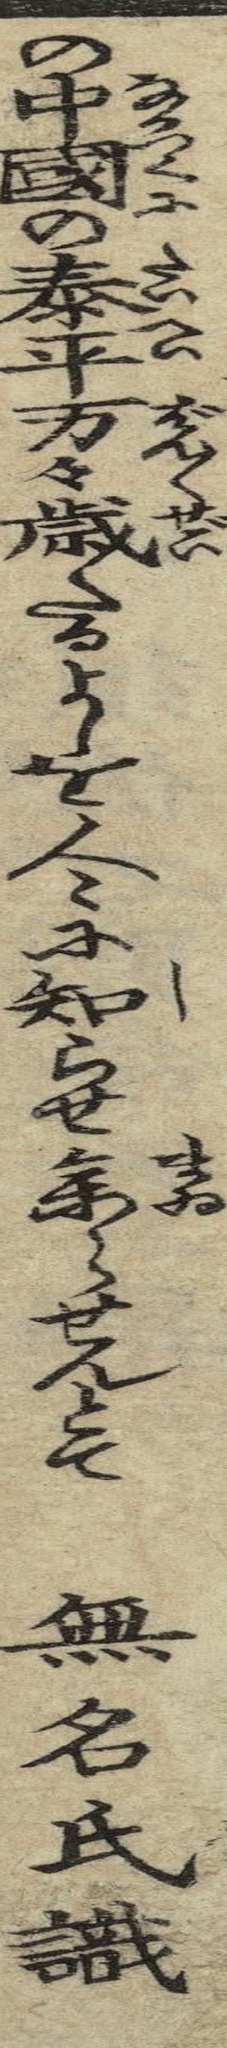の中国の泰平万々歳たるよしを人々に知らせ参らせんとて無名氏識
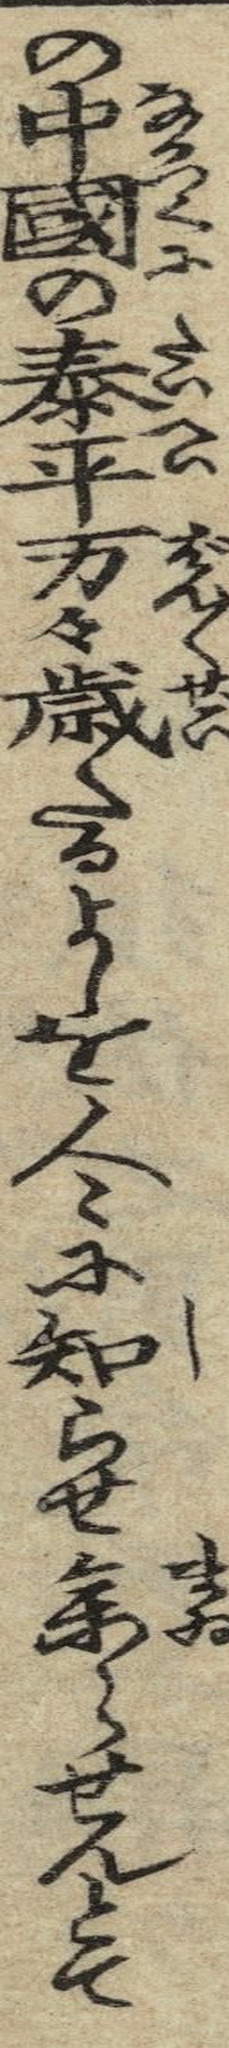の中国の泰平万々歳たるよしを人々に知らせ参らせんとて無名氏識

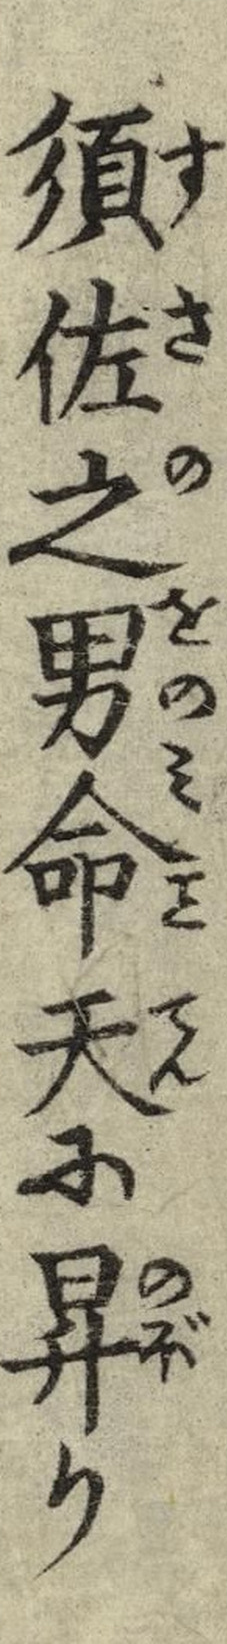須佐之男命天に昇り
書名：地震年代記
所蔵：東京大学地震研究所図書室 Earthquake Research Institute Library, The University of Tokyo, JAPAN
